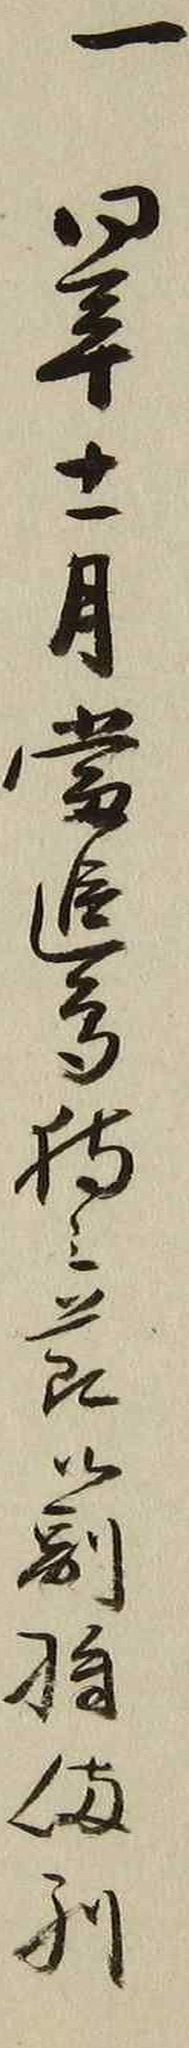一同年十一月当追鳥狩之節御副将備列
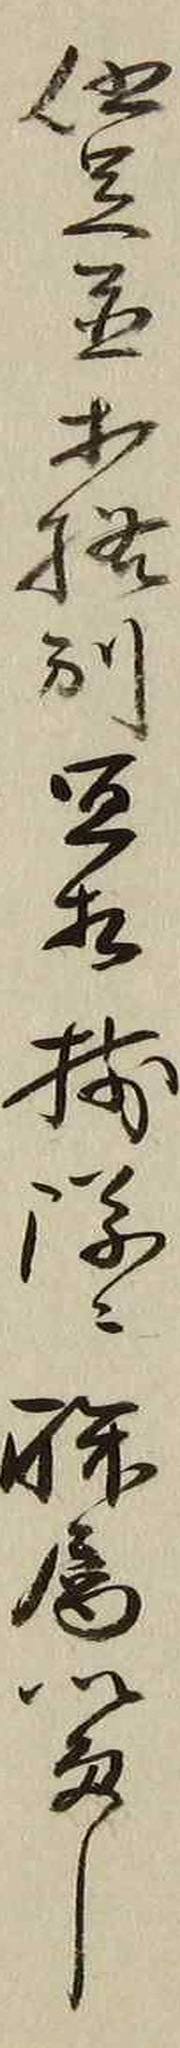伍足並等格別宜相揃隊ニ聯属いたし
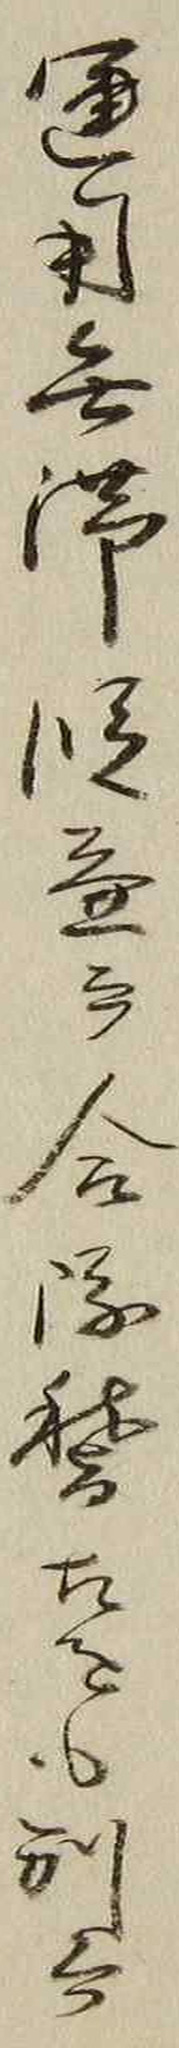軍用無滞段兼而合隊稽古をも別而
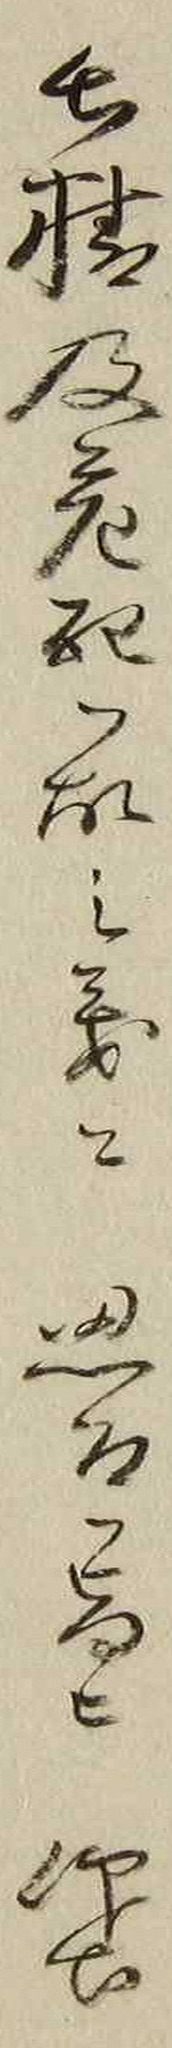出精及差配候故之義と思召候旨被仰出
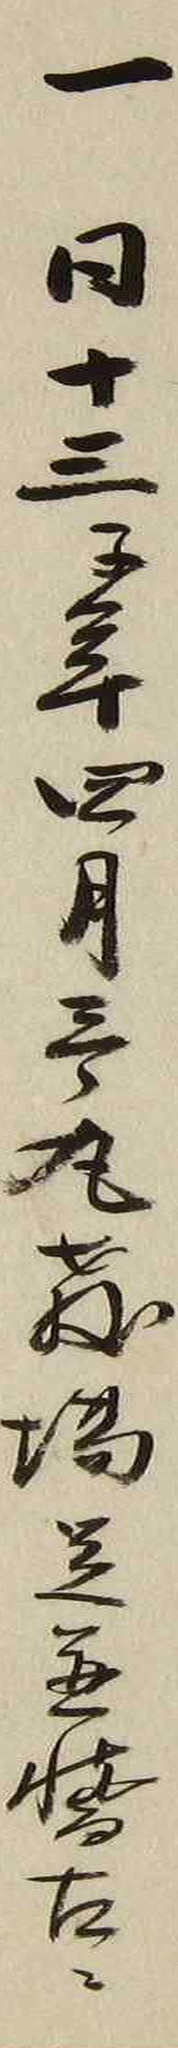一同十三子年四月三ノ丸教場足並稽古ニ
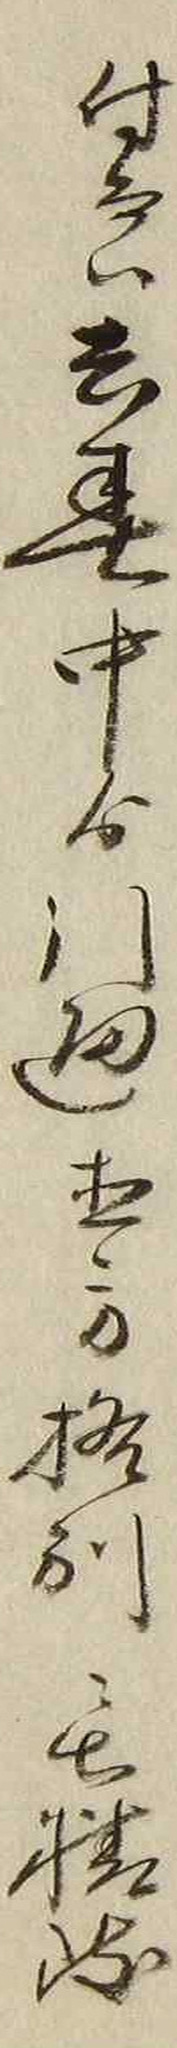付而ハ去春中ゟ引通直方格別ニ出精致
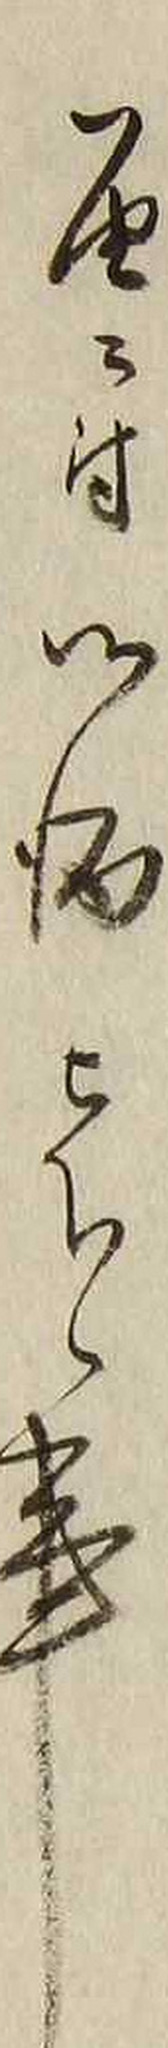候由ニ付御酒被下候事
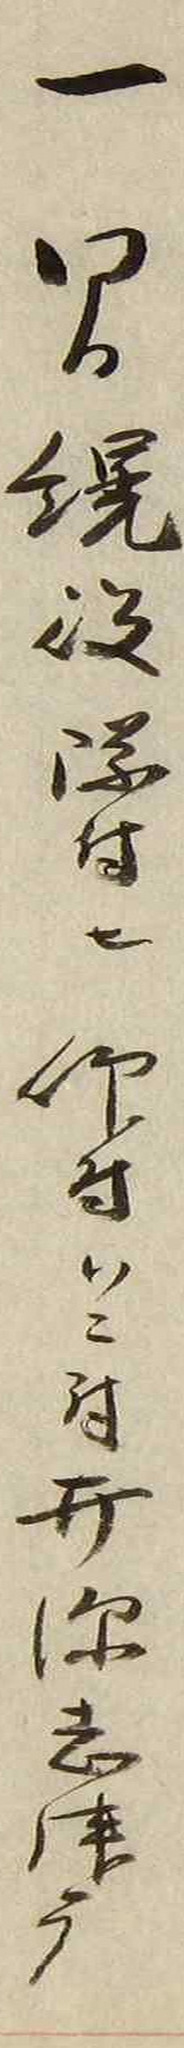一同日縨役隊付被仰付候ニ付井深志津摩
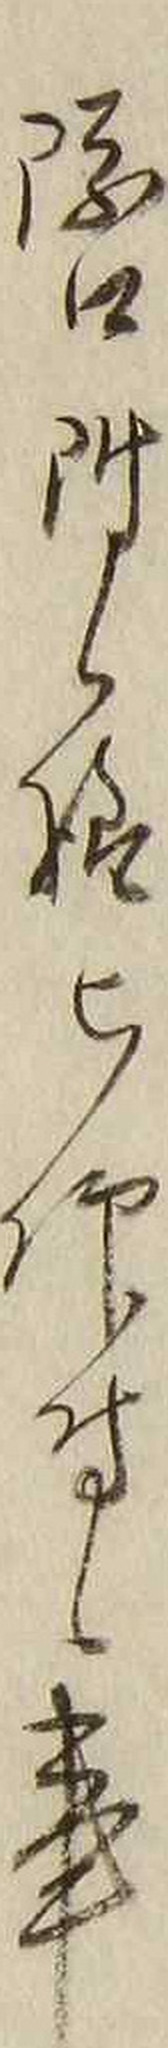隊江附候様被仰付候事

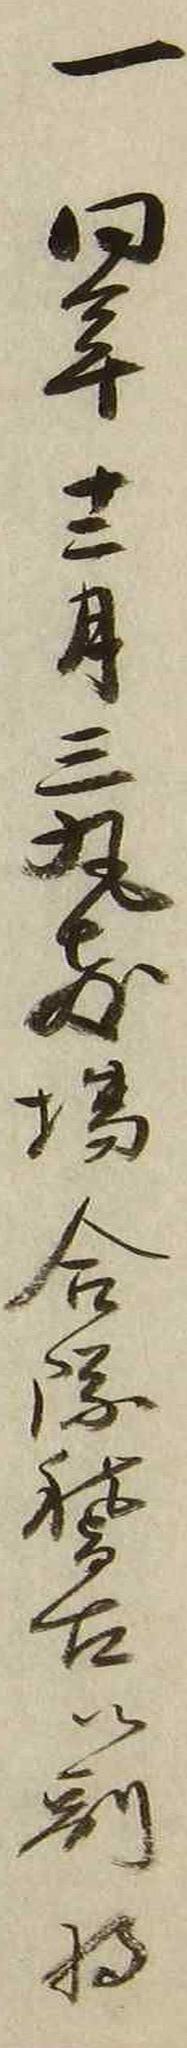一同年十二月三丸教場合隊稽古御副将
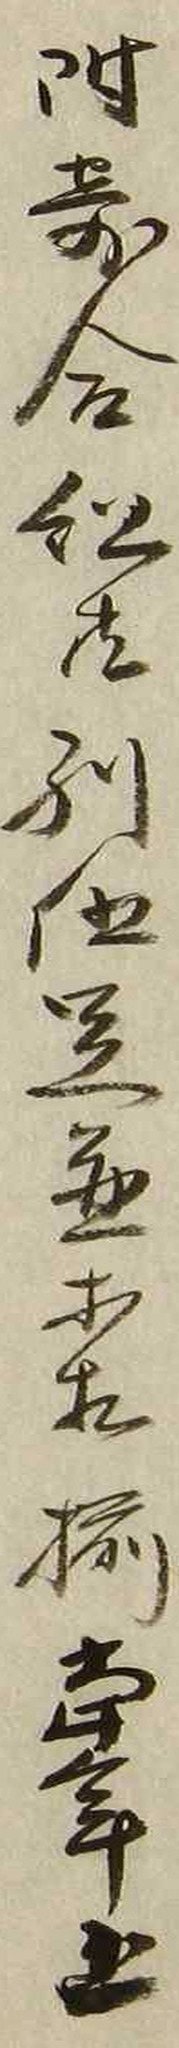附寄合組共列伍足並等相揃当年上
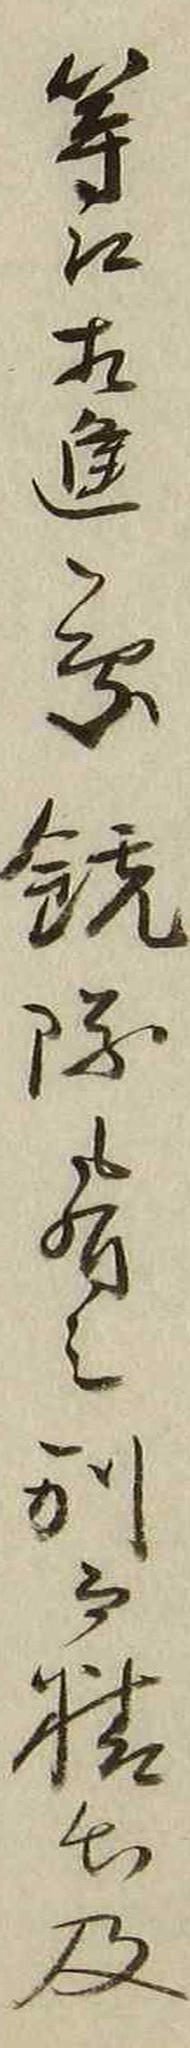等江相進候処銃隊も有之別而精出及
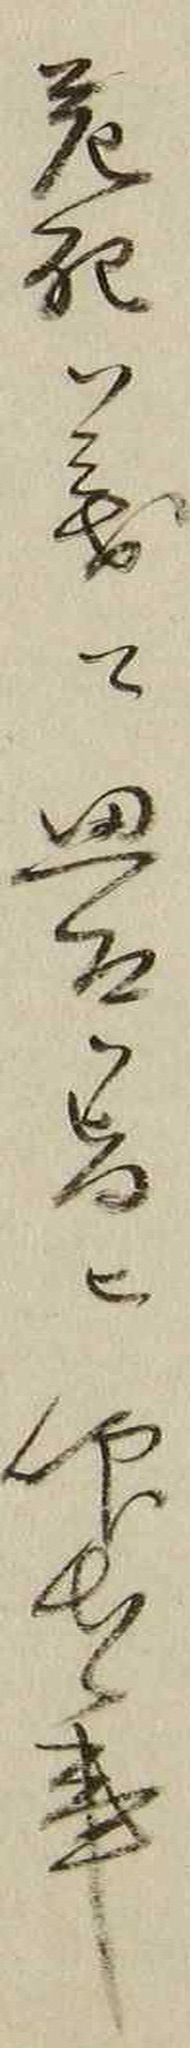差配候義と思召候旨被仰出候事
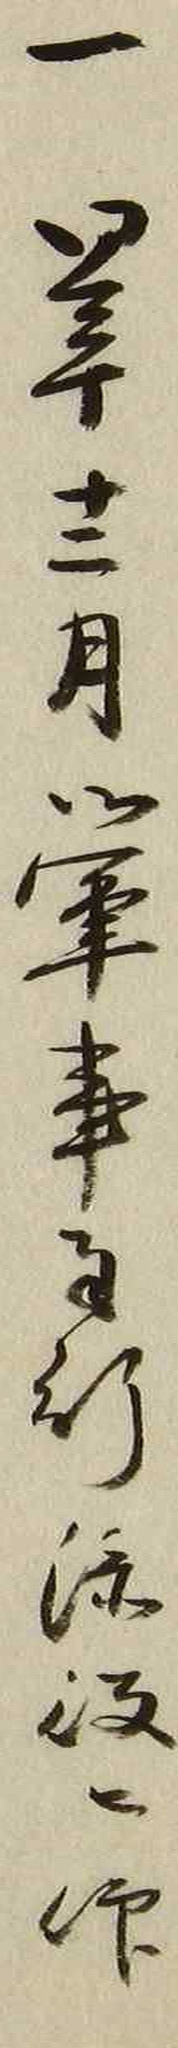一同年十二月御軍事奉行添役被仰
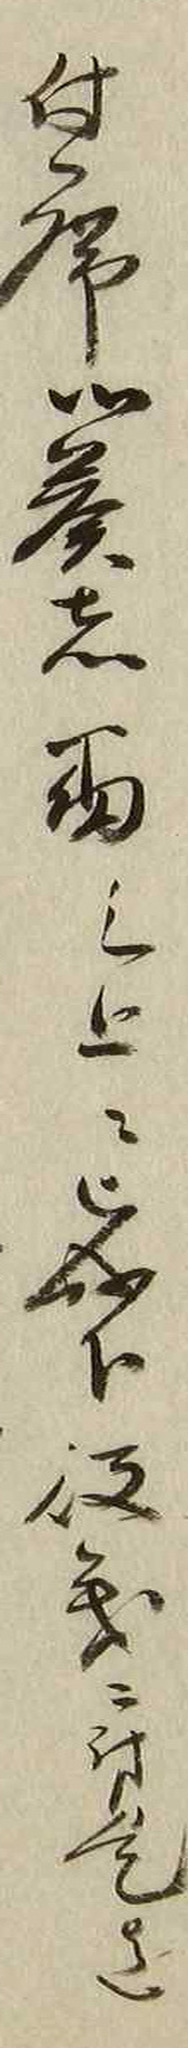付席御奏者番之上ニ被成下役義ニ付是迄
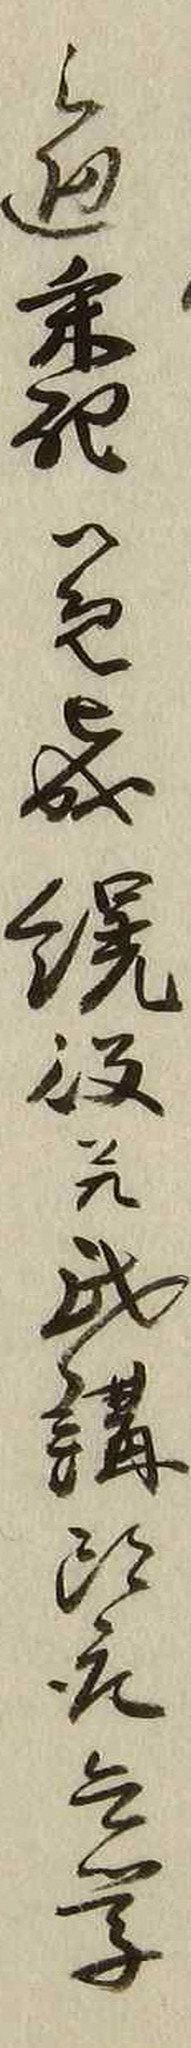之通采配御免被成縨役并武講頭取兵学
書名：諸士系譜　巻之311　し之部1
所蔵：会津若松市立会津図書館
